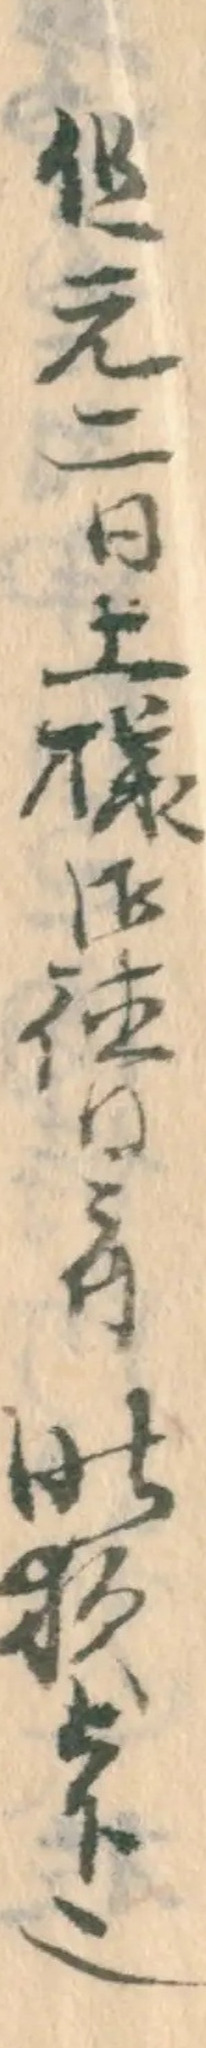但元二日上様御徳日ニ付昨夜被下也
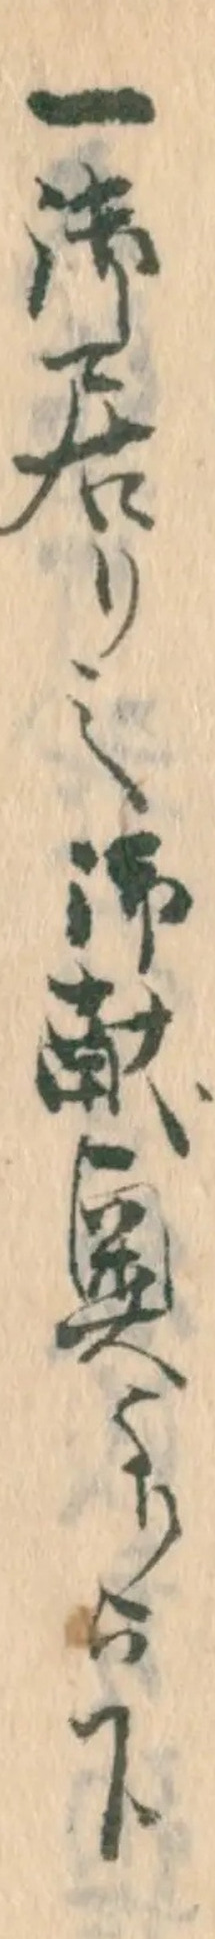一御居り之御献奥より被下
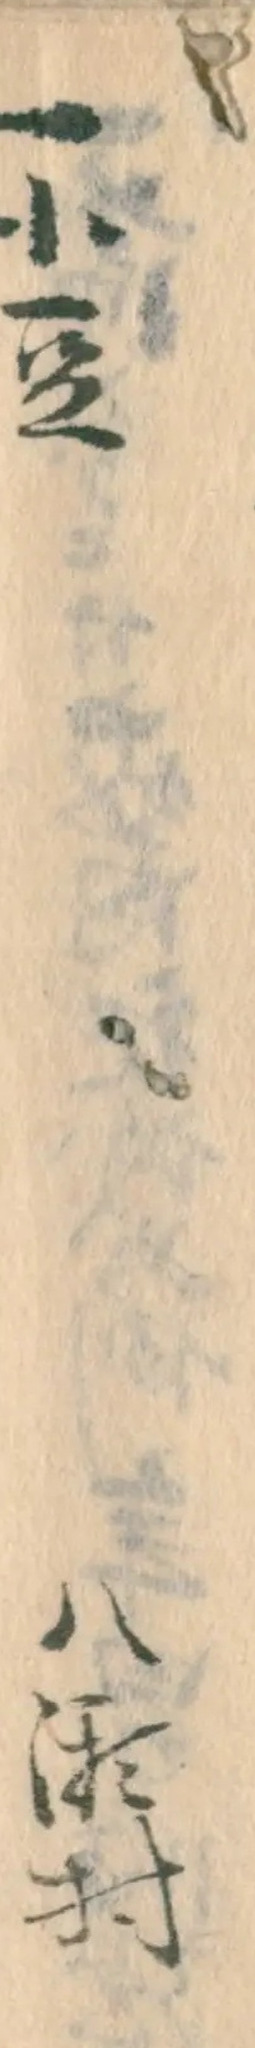一小豆八瀬村
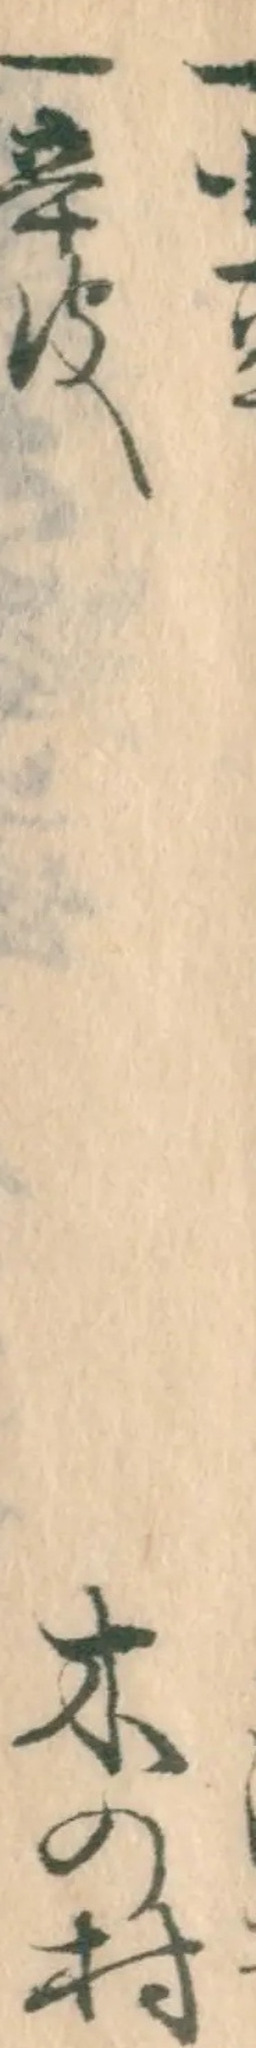一辛皮木の村
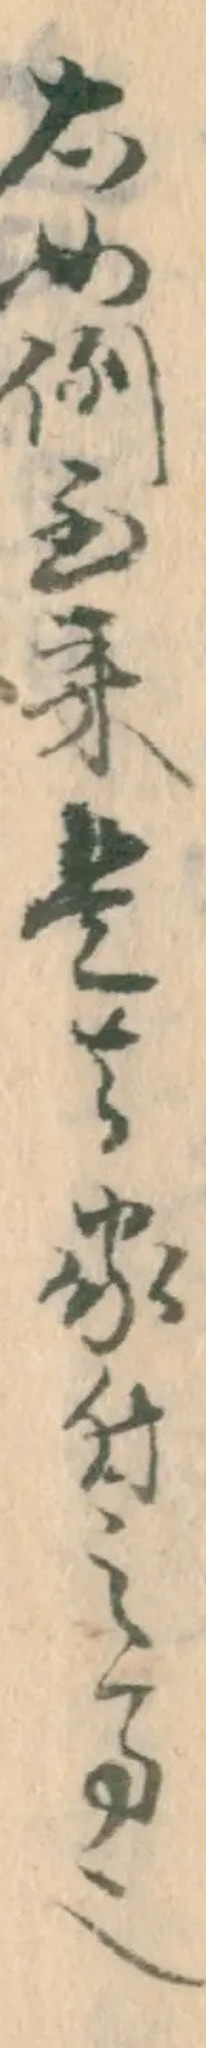右如例到来是は家付之事也
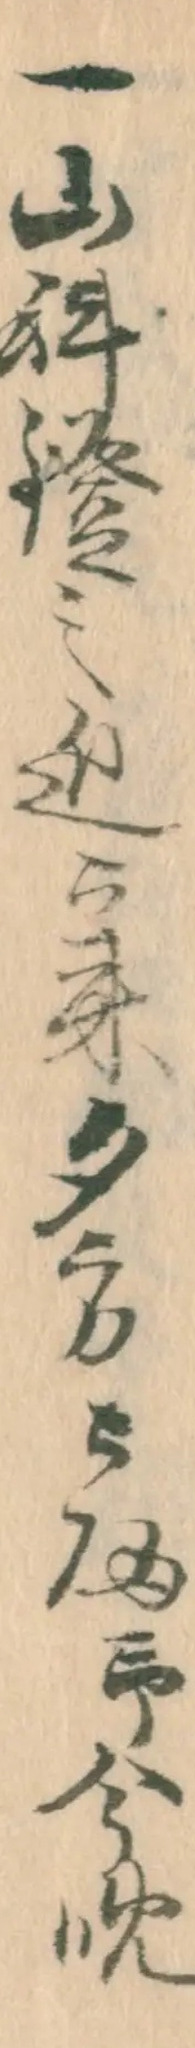一山科鐙之進被来夕方被帰余今晩
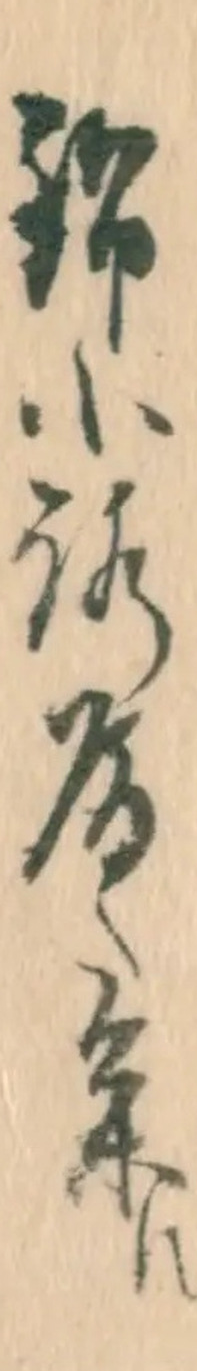錦小路殿へ参ル
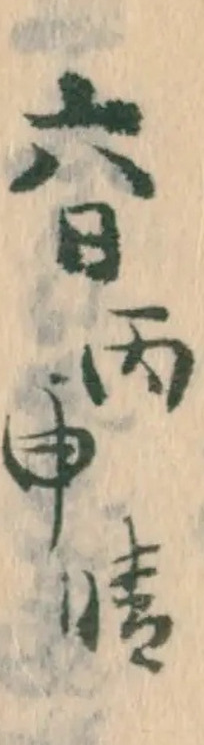六日丙申晴
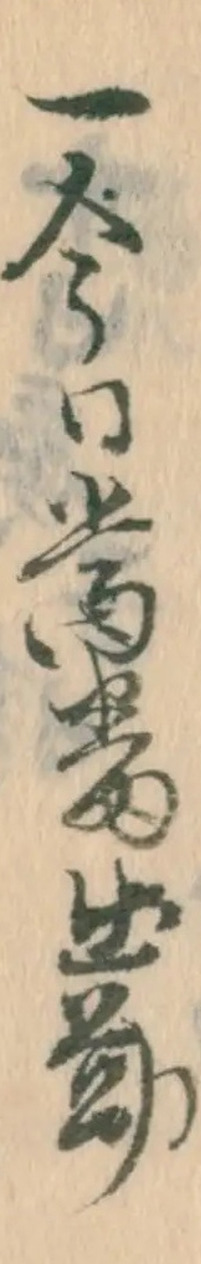一今日当番出勤
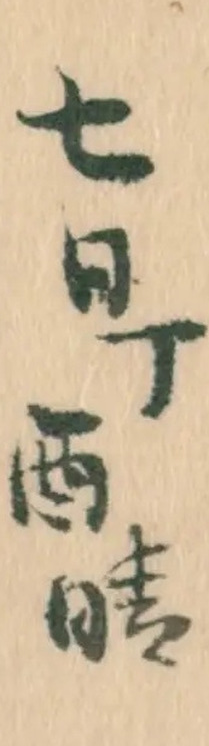七日丁酉晴
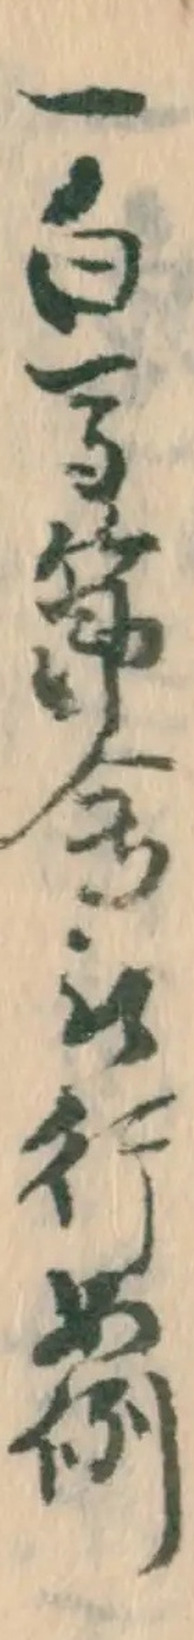一白馬節会被行如例
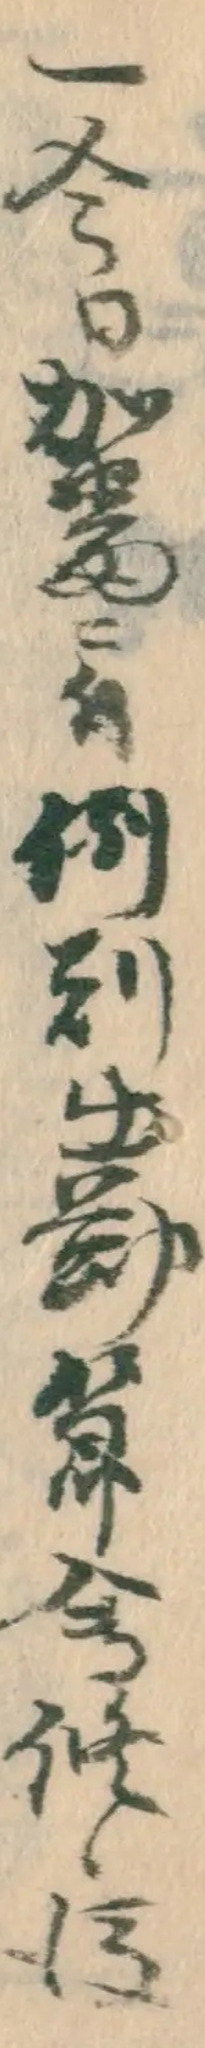一今日加番ニ付例刻出勤節会修候後
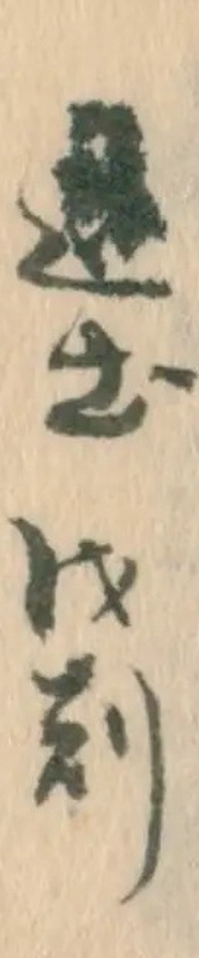退出戌刻
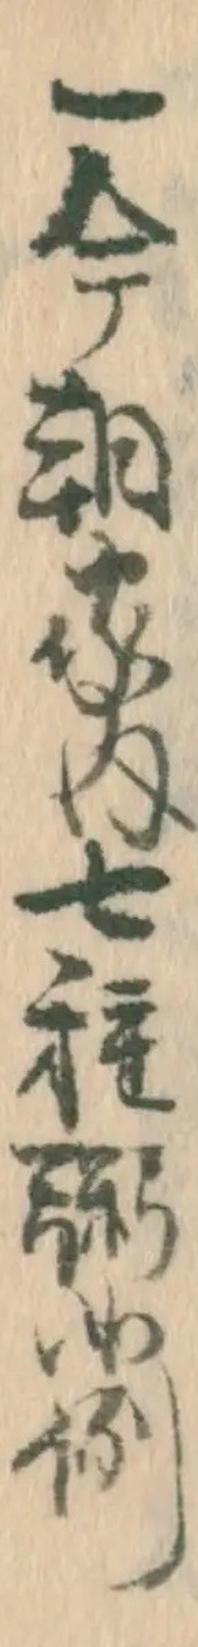一今朝家内七種粥如例
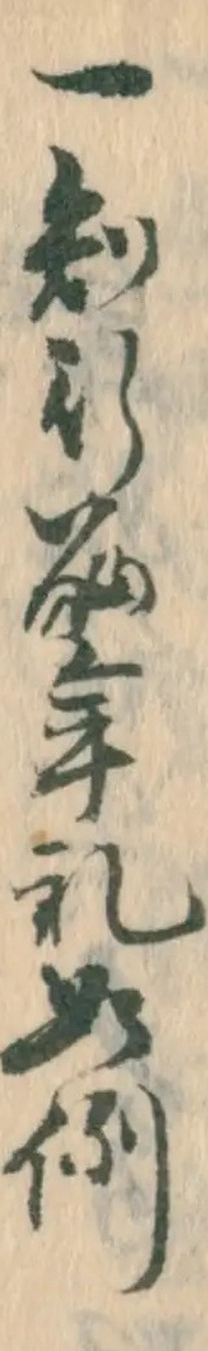一知行所年礼如例
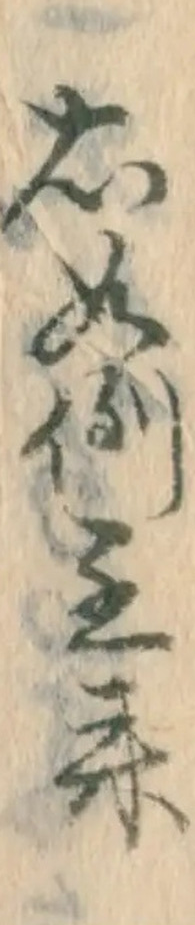右如例到来
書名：禁裏御所御用日記. [131]
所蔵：国立国会図書館 National Diet Library, JAPAN
